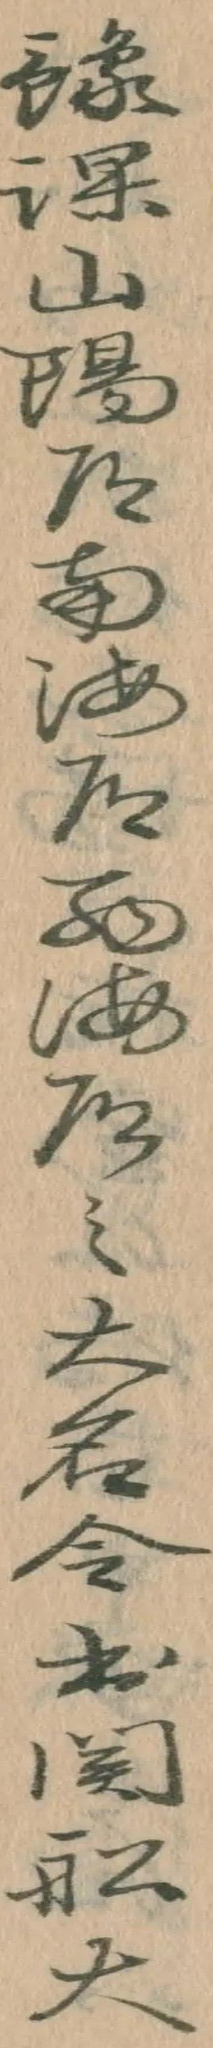豫課山陽道南海道西海道之大名令出関舩大
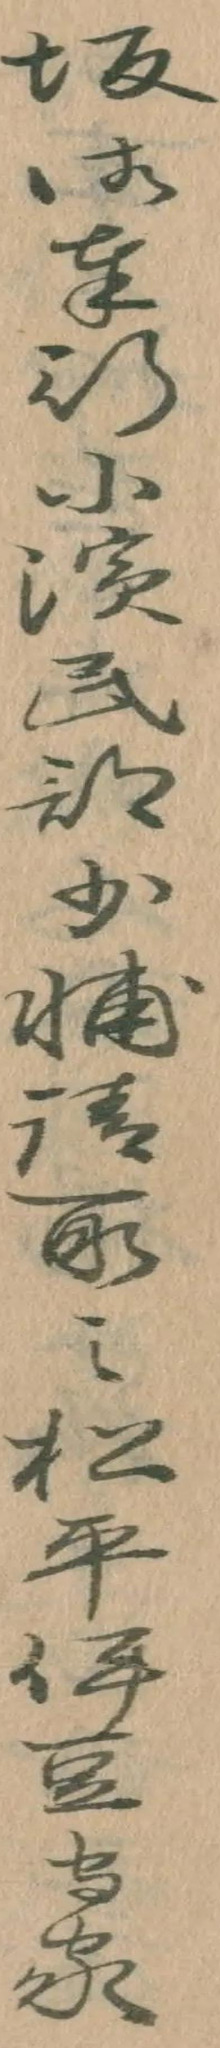坂御奉行小浜民部少輔請取之松平伊豆守家
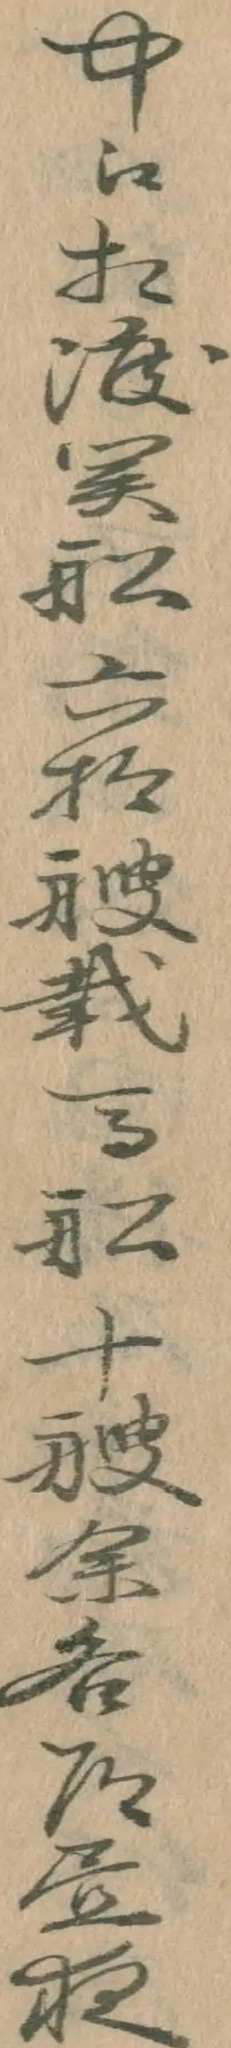中江相渡関舩六拾艘載馬舩十艘余各道昼夜
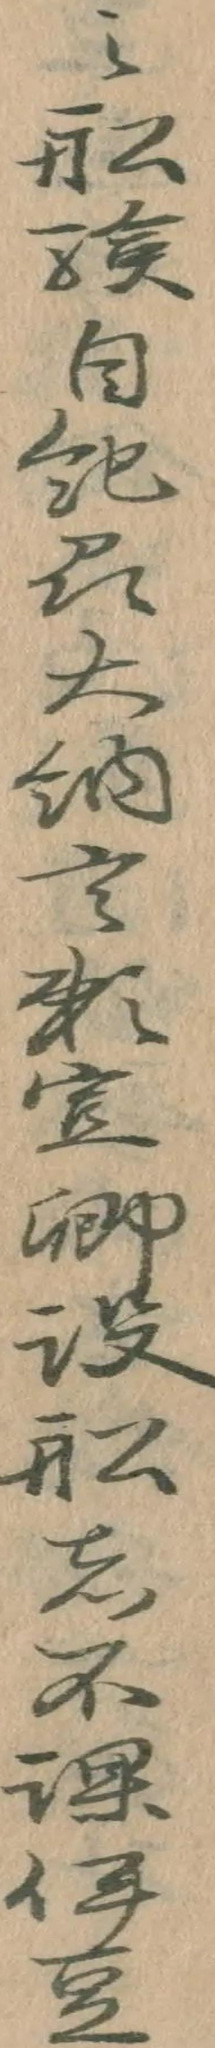之舩験自紀州大納言頼宣卿設舩志不課伊豆
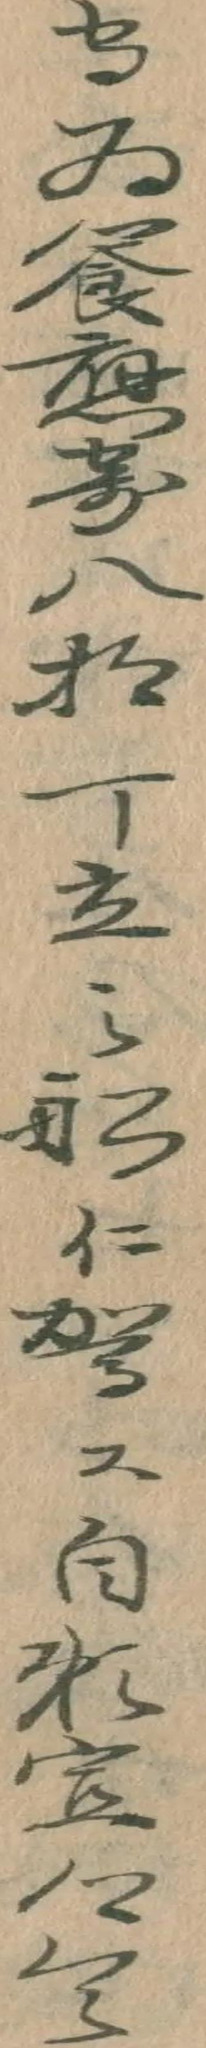守ゐ饗応寄八拾丁立之舩仁駕す自頼宣卿令
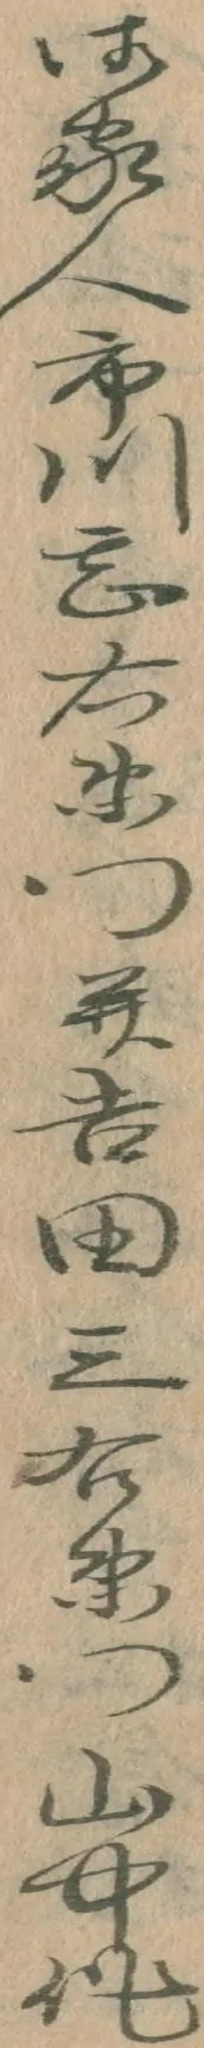御家人市川甚右衛門幷吉田三右衛門山中作
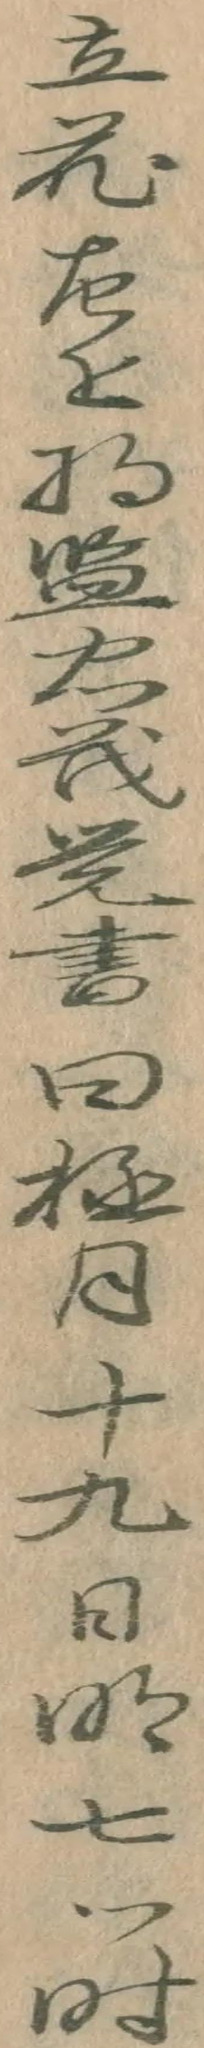立花左近将監忠茂覚書曰極月十九日明七つ時
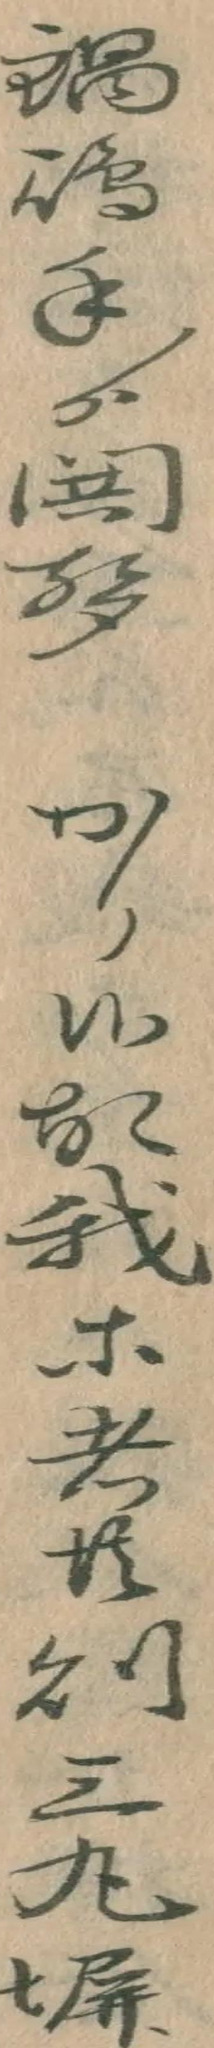鍋島手ゟ鬨声加り候故我等者共則三丸塀
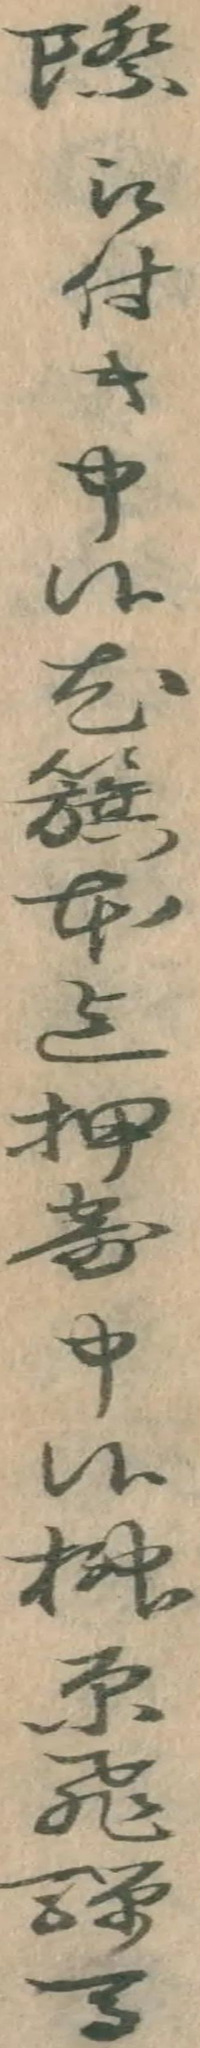際被付き申候尤籏本迄押寄申候榊原飛騨馬
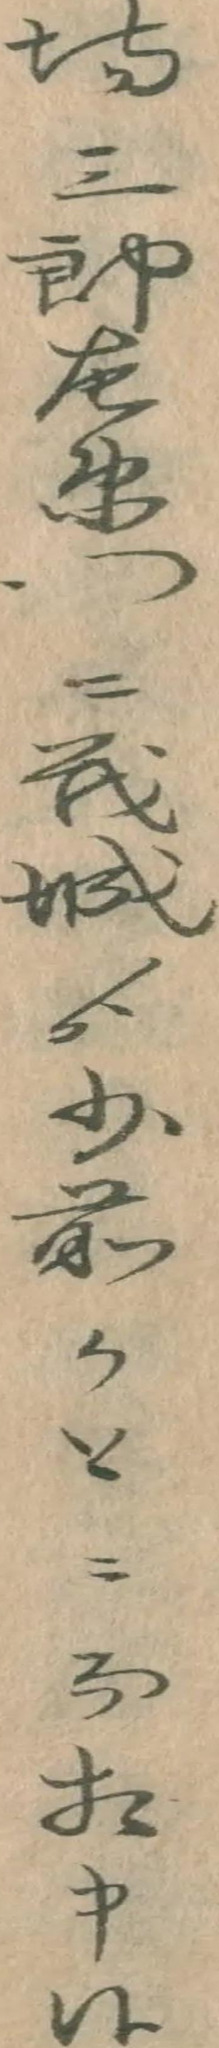場三郎左衛門に茂城ゟ少前かとに而相申候

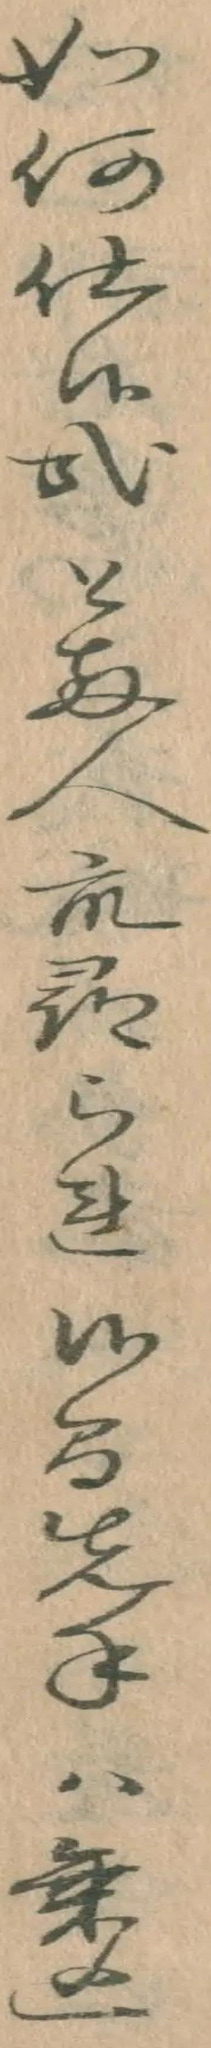如何仕候哉と両人衆尋ら連候間先手は乗込
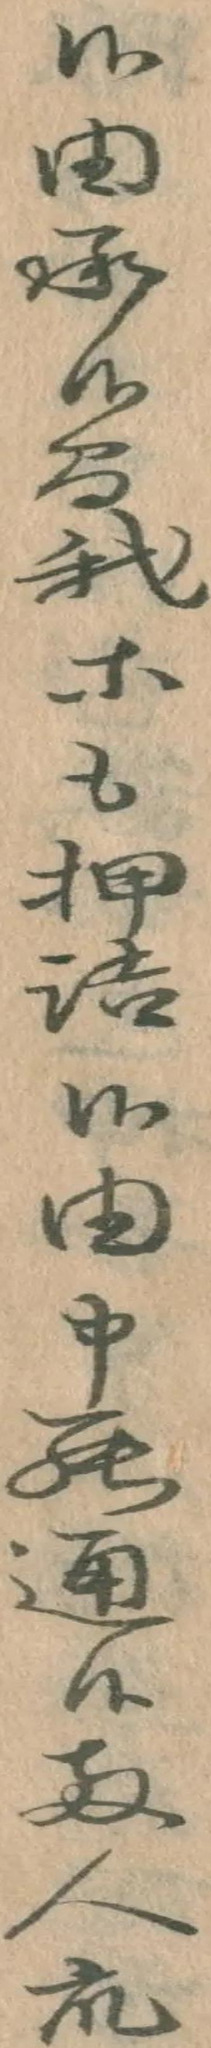候由承候間我等も押詰候由申罷通候両人衆
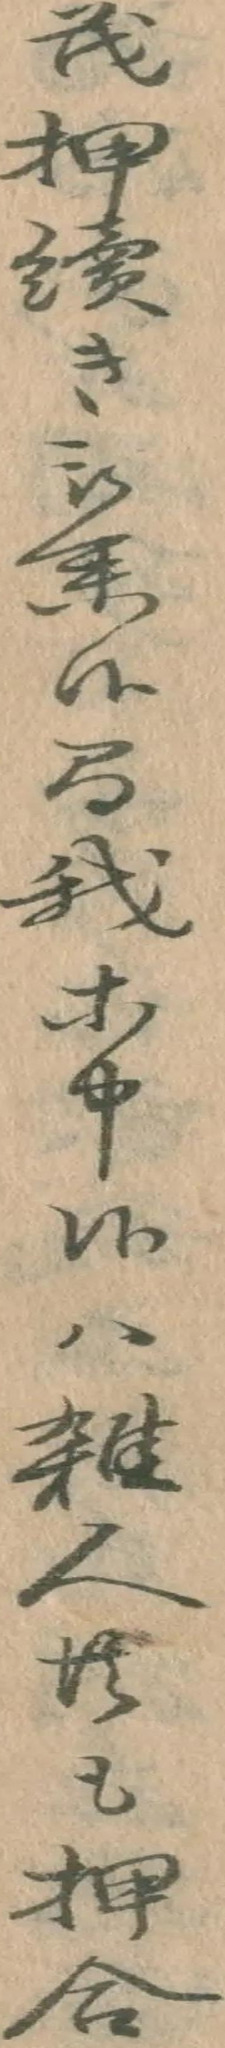茂押続き被参候間我等申候は雑人共も押合
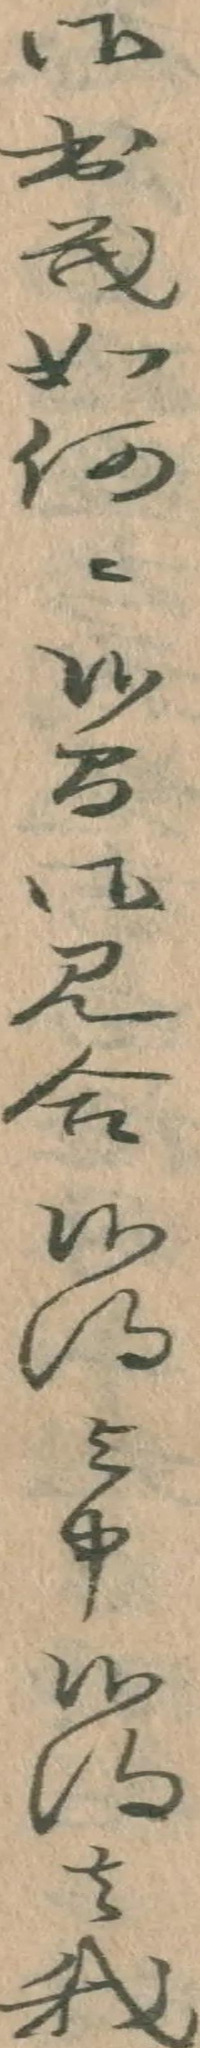御出茂如何に候間御見合候得与申候得者我
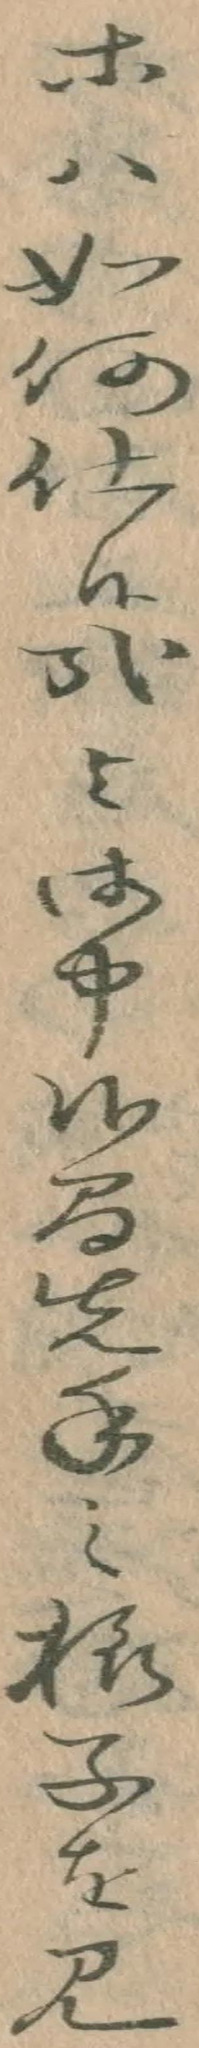等は如何仕候哉与御申候間先手之様子を見
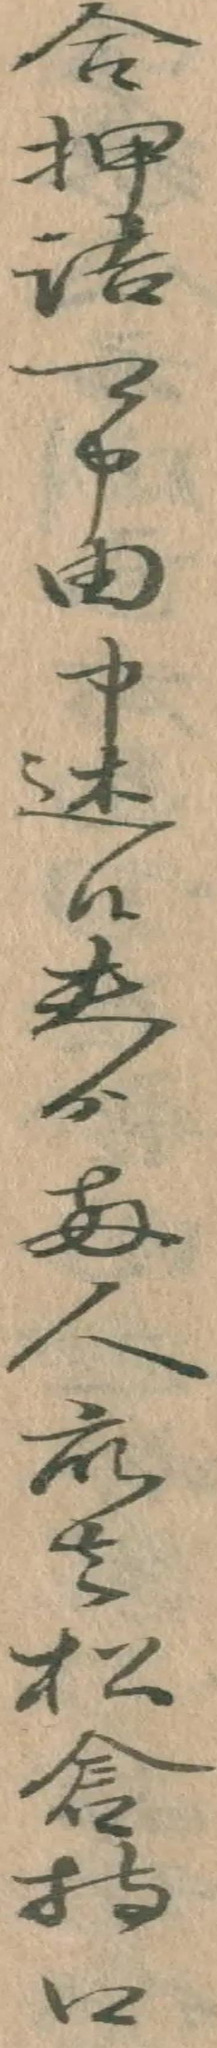合押詰可申由申述候夫ゟ両人衆者松倉持口
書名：切支丹御退治記 49巻. [4]
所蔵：国立国会図書館 National Diet Library, JAPAN
